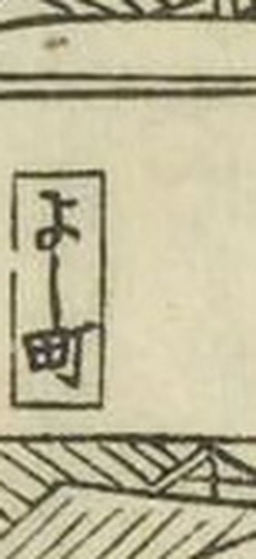よし町
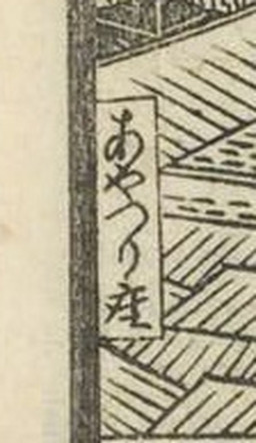あやつり座
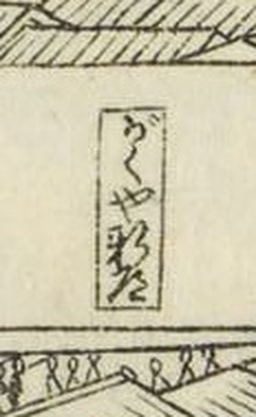がくや新道
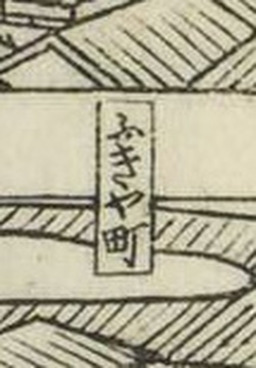ふきや町

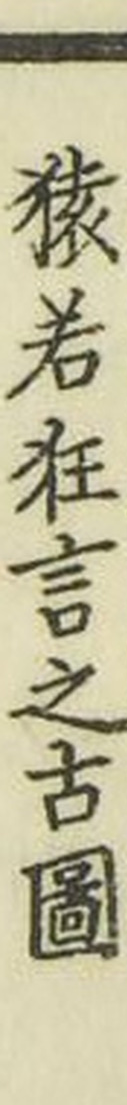猿若狂言之古圖

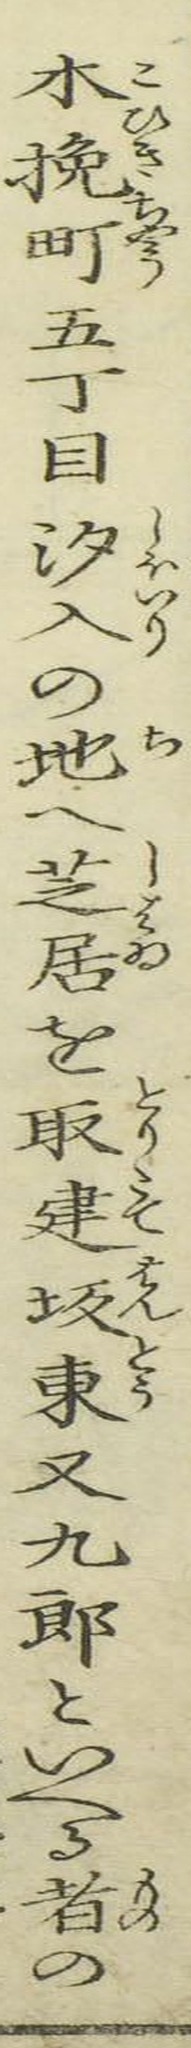木挽町五丁目汐入の地へ芝居を取建坂東又九郎といへる者の
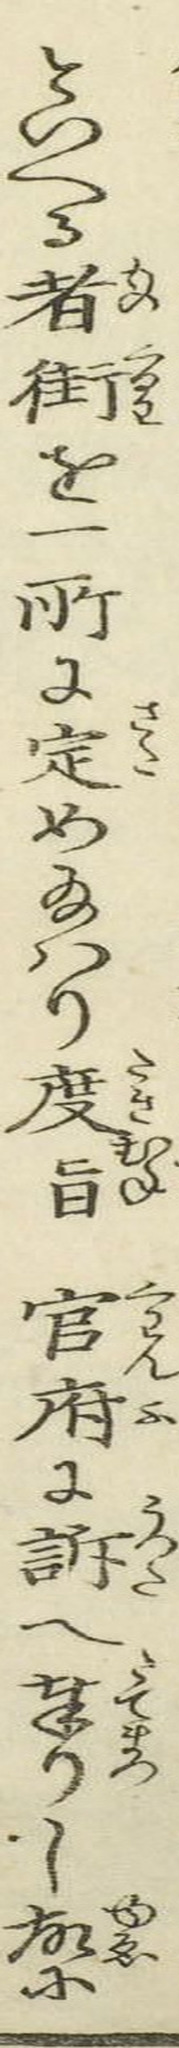といへる者街を一所に定め給はり度旨官府に訴へ奉りし故に
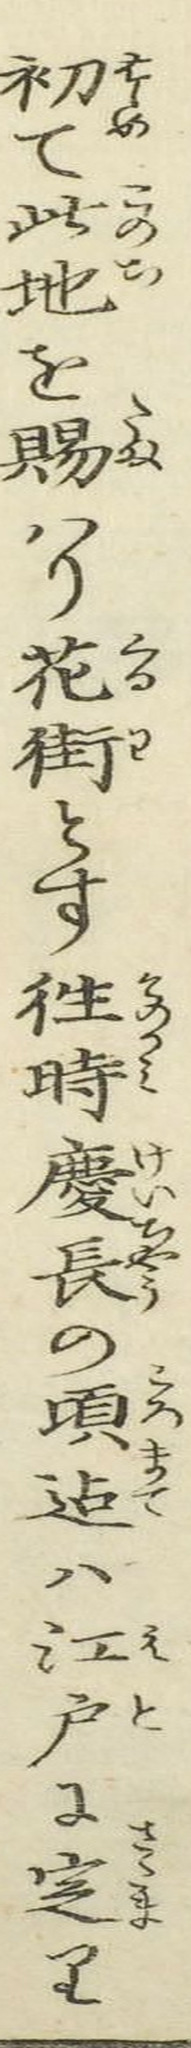初てこの此地を賜はり花街とす往時慶長の頃迄は江戸に定り
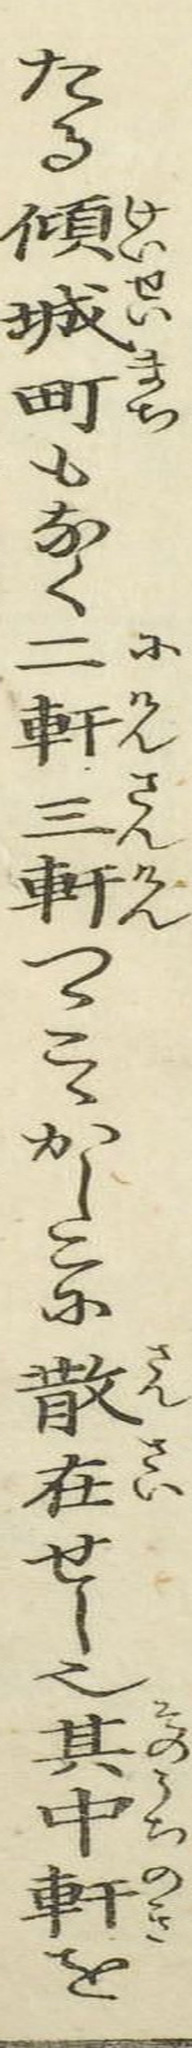たる傾城町もなく二軒三軒つゝこゝかしこに散在せし也其中軒を
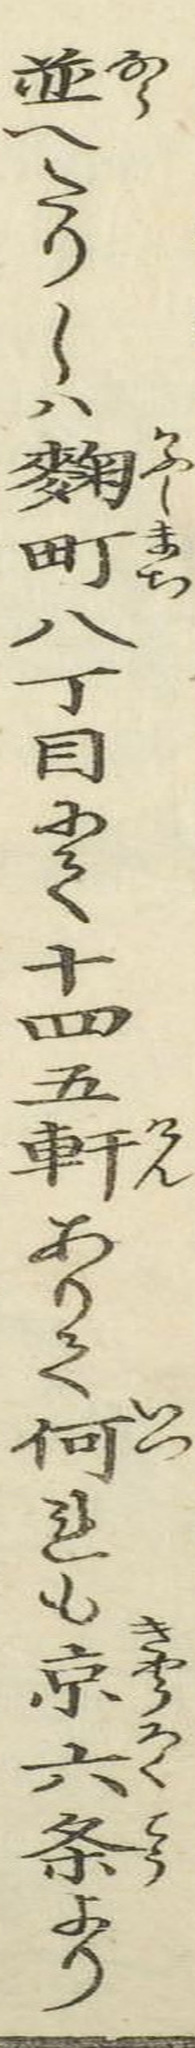並へたりしは麴町八丁目にて十四五軒ありて何れも京六条より
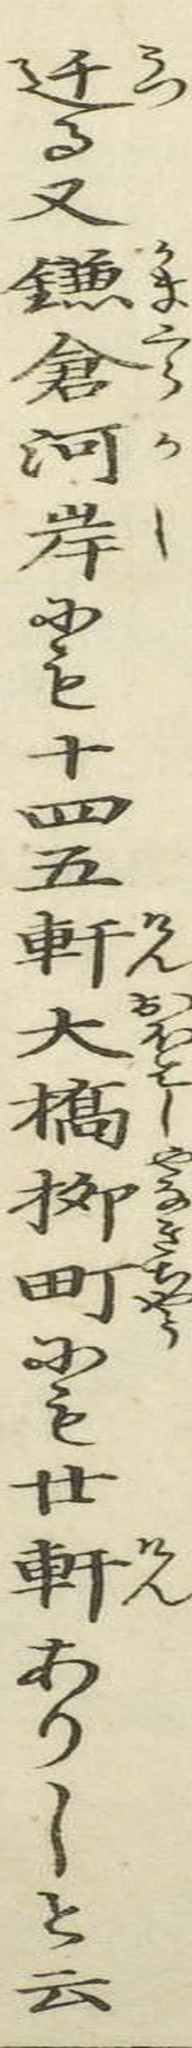遷る又鎌倉河岸にも十四五軒大橋柳町にも廿軒ありしと云
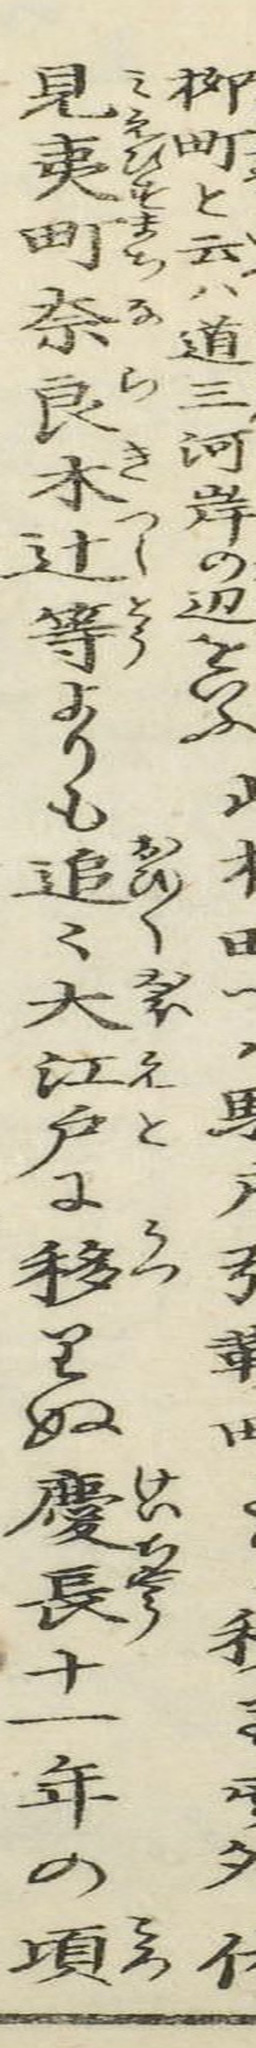見夷町奈良木辻等よりも追々大江戸に移りぬ慶長十一年の頃
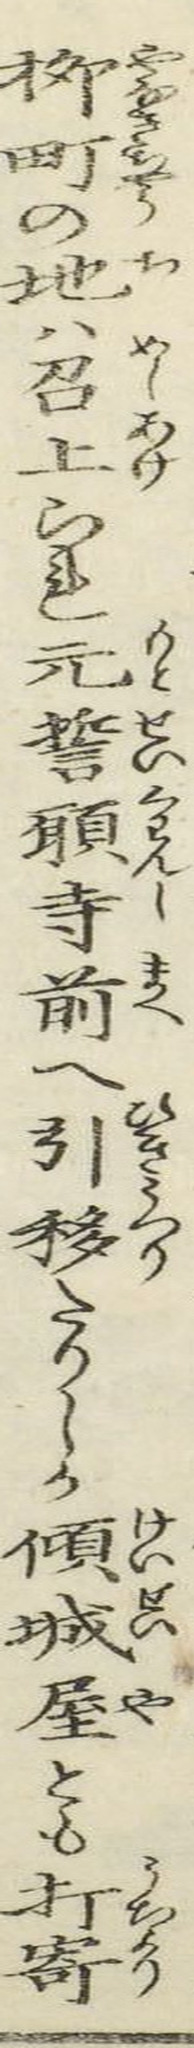柳町の地は召上られ元誓願寺前へ引移たりしか傾城屋とも打寄
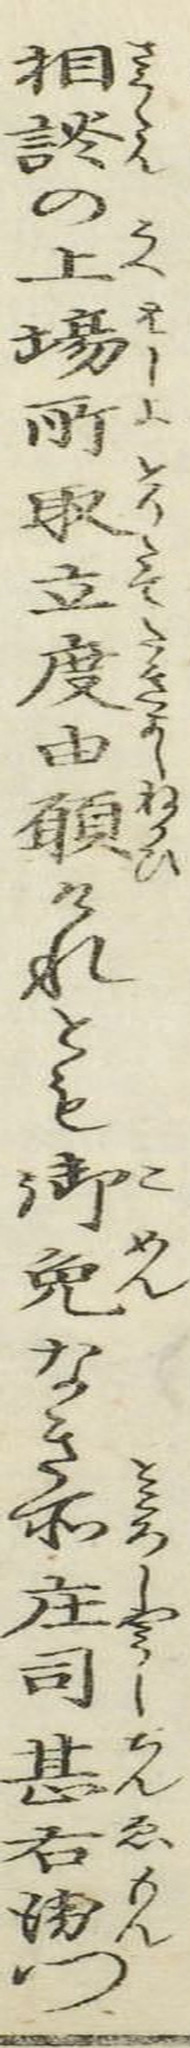相談の上場所取立度由願けれとも御免なき所庄司甚右衛門
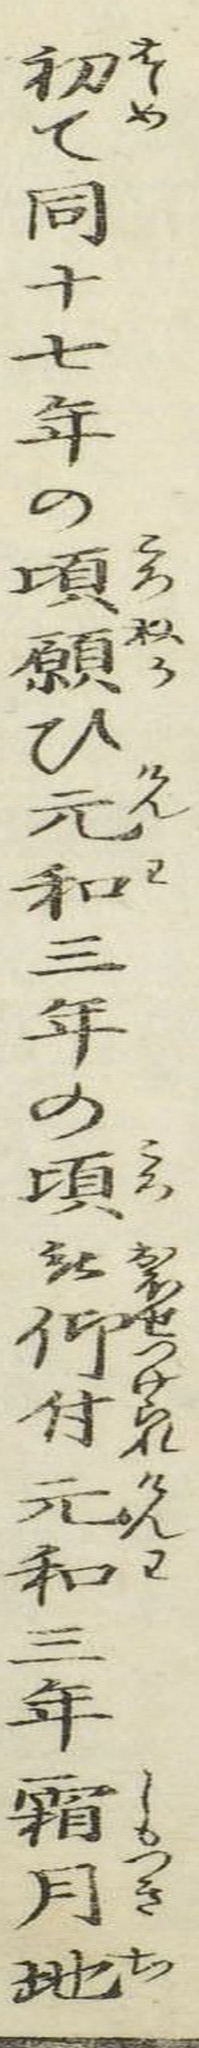初て同十七年の頃願ひ元和三年の頃被仰付元和三年霜月地
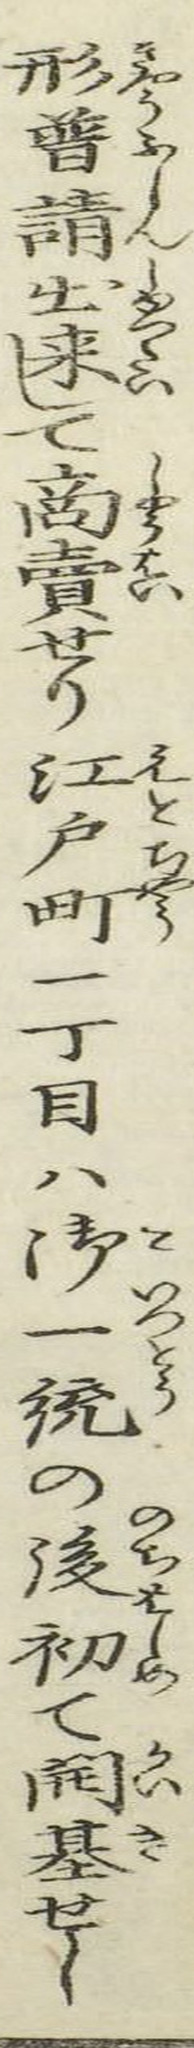形普請出来して商賣せり江戸町一丁目は御一統の後初て開基せし
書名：江戸名所図会 20巻 巻之2
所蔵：東京学芸大学教育コンテンツアーカイブ
